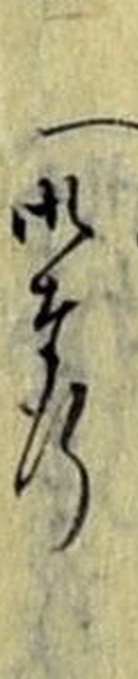御奉行
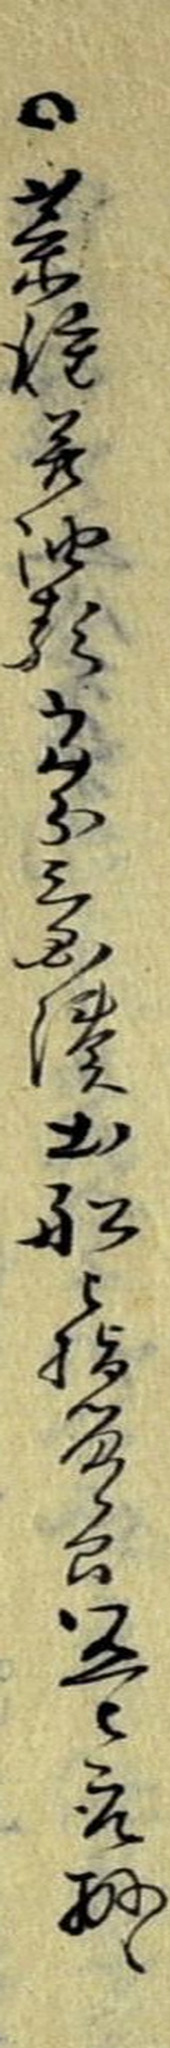○薬種并油類当分三国湊出船被指留候間宜被取扱候
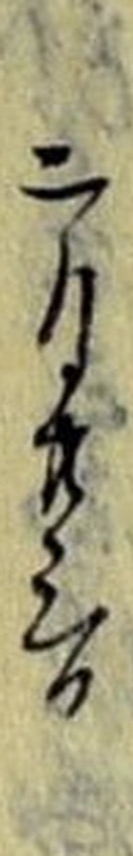二月廿三日
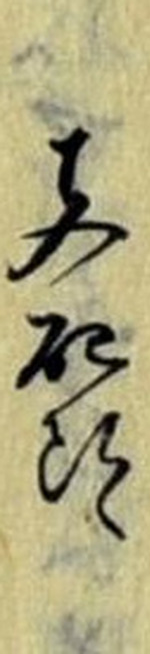支配頭へ
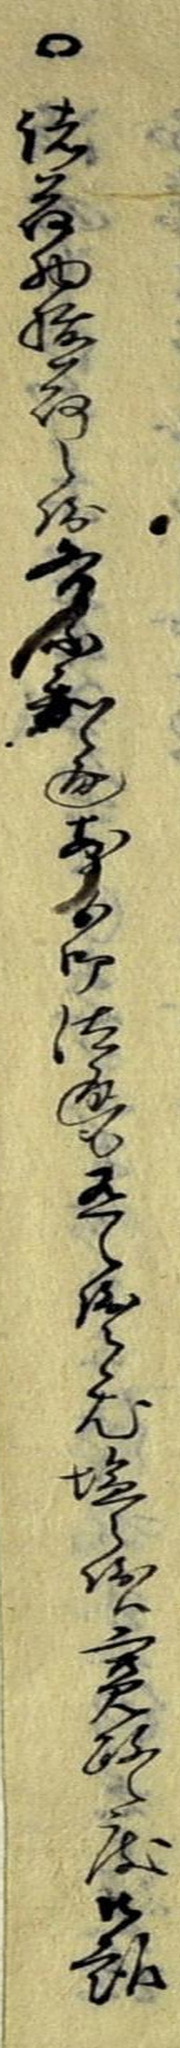○諸荷物抜荷之儀各承知之通前々ゟ御法通も有之儀ニ候尤塩之儀ハ寛政之度御趣

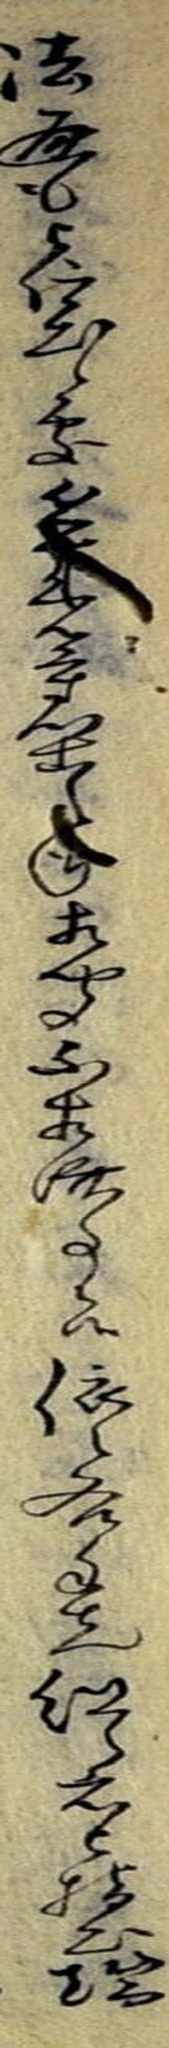法通も被仰出候処近来等閑之趣相聞不相済事ニ候依之各手先組之者被指出端
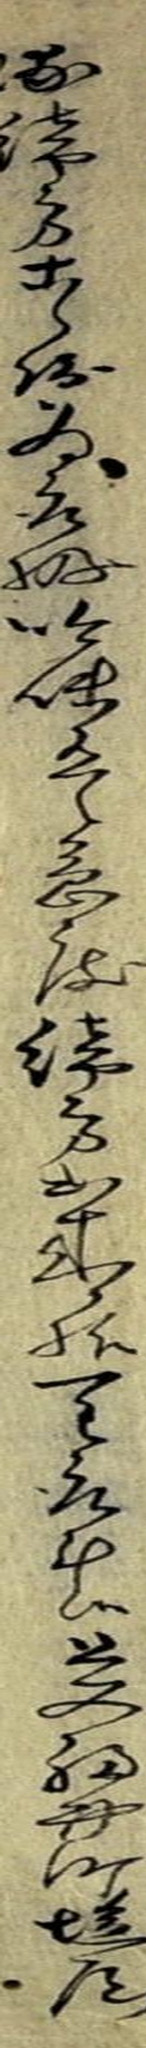浦締方等之儀為取扱吟味有之急度締方出来候様可被取計候且又福井町塩屋
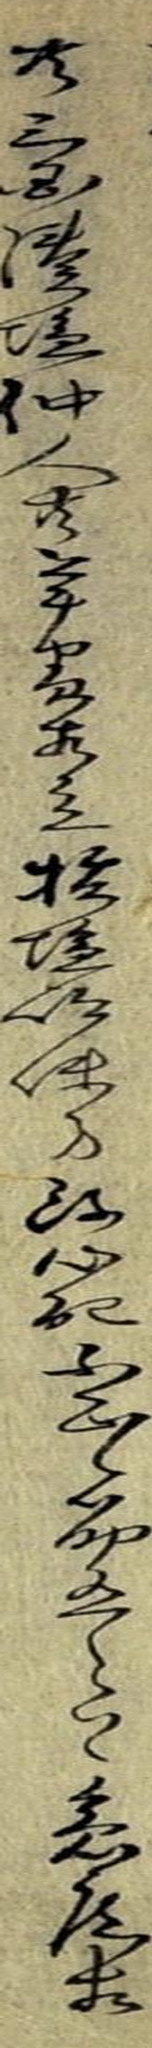共三国湊塩仲人共年番相立抜塩吟味方致心配不正之筋有之候ハヽ急度相
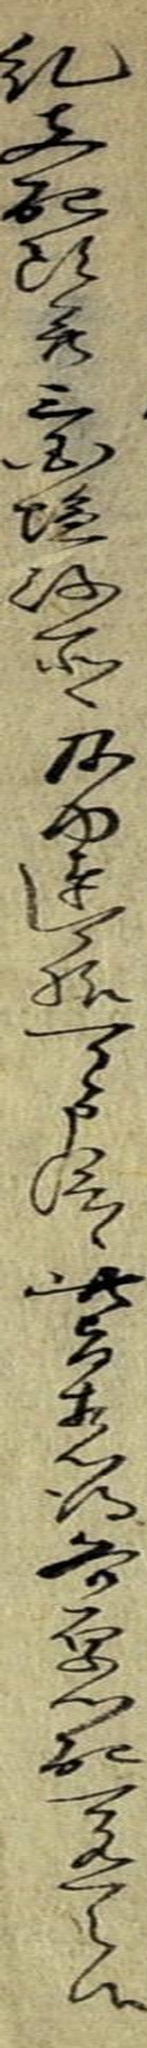糺支配頭并三国塩役所へ及内達候様可被申渡候此旨相心得各厚心配可有之候
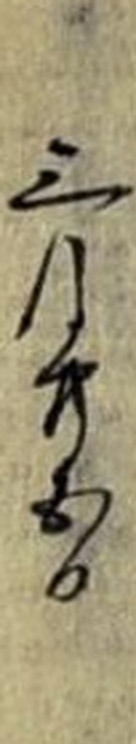三月廿五日
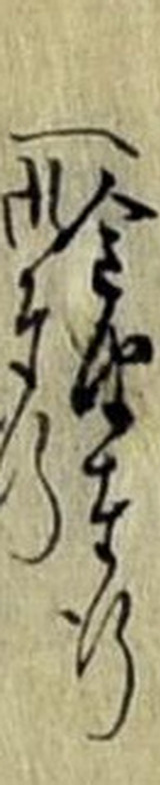御奉行
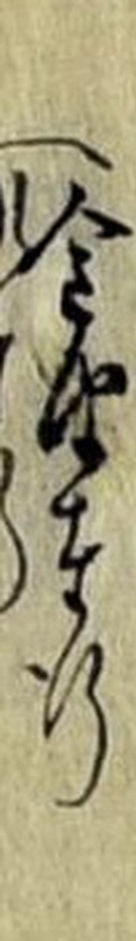金津奉行
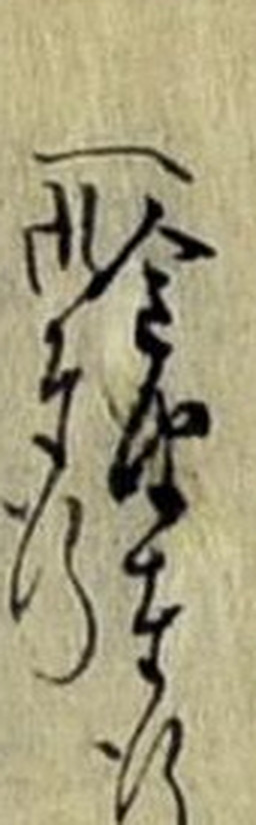御奉行
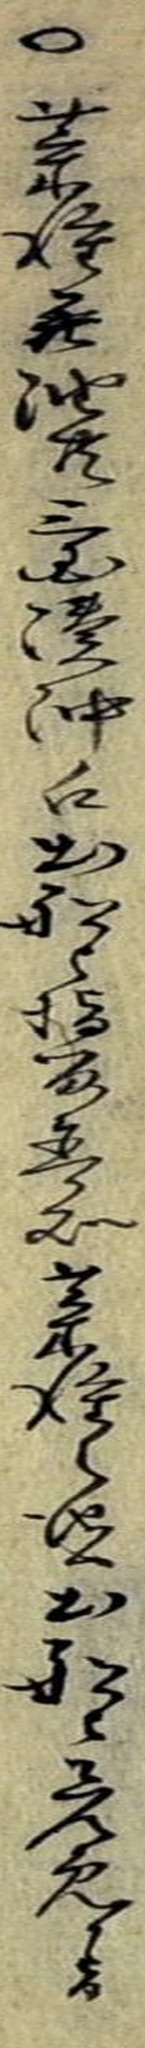○菜種并油共三国湊沖ノ口出船被指留置候処菜種之儀ハ出船被差免候旨
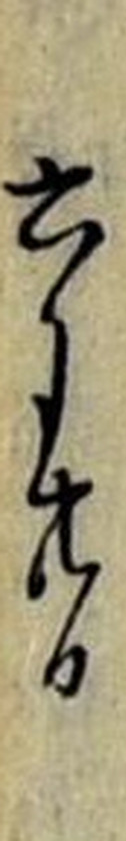六月廿日
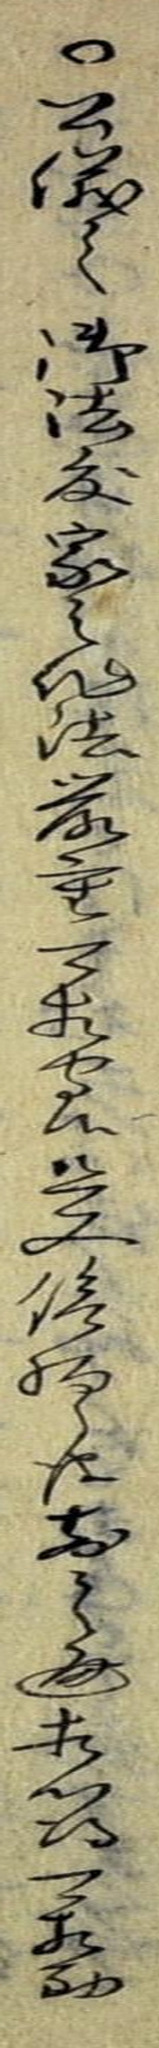○公儀之御法度家之作法厳重可相守候且又倹約之儀前々之通相心得可相勤
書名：命令之部 五
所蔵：福井県文書館 Fukui Prefectural Archives
